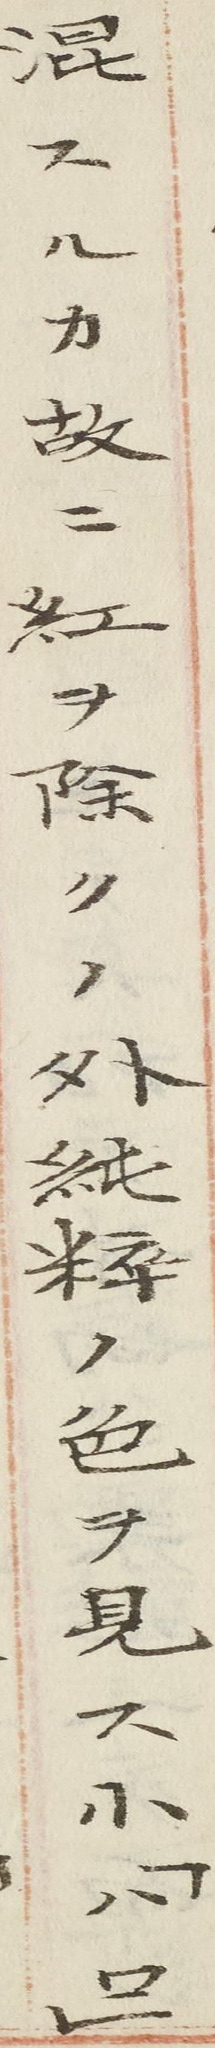混スルカ故ニ紅ヲ除クノ外純粋ノ色ヲ見ス小「ハロ」
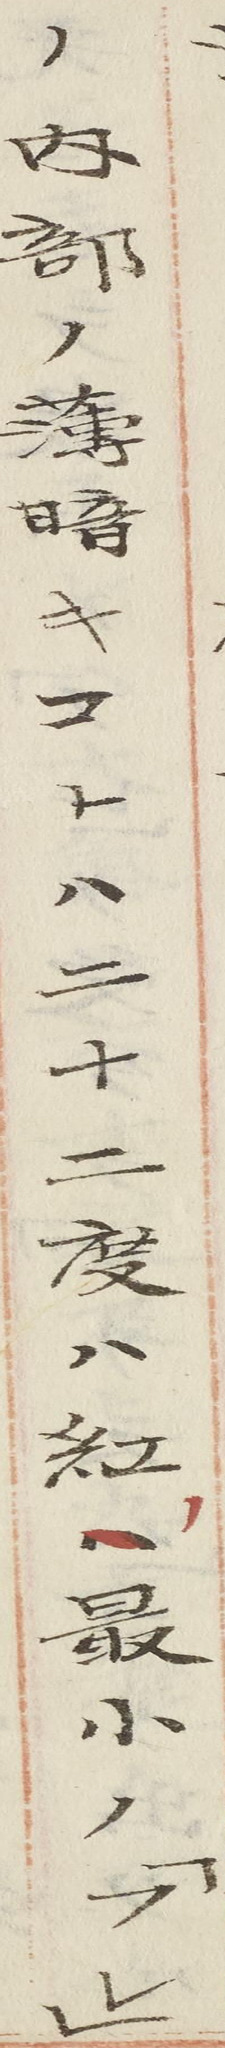ノ内部ノ薄暗キコトハ二十二度ハ紅ハ最小ノ「フレ」
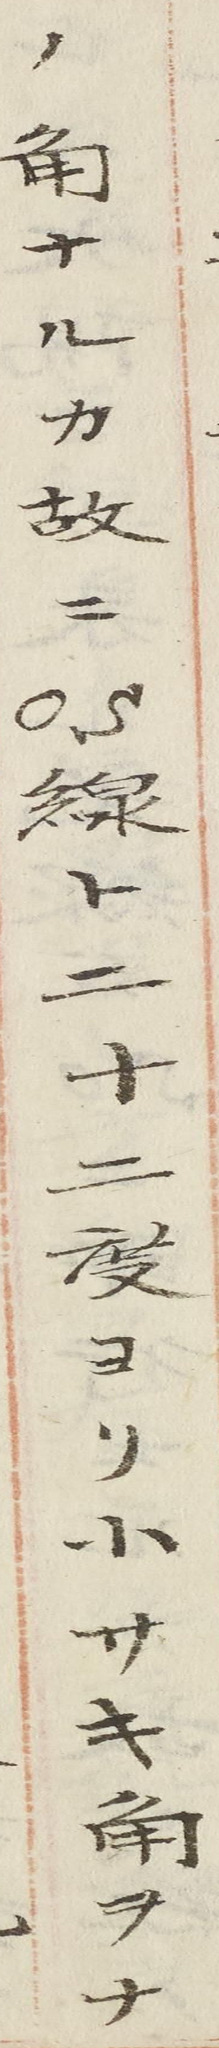ノ角ナルカ故ニＯＳ線ト二十二度ヨリ小サキ角ヲナ
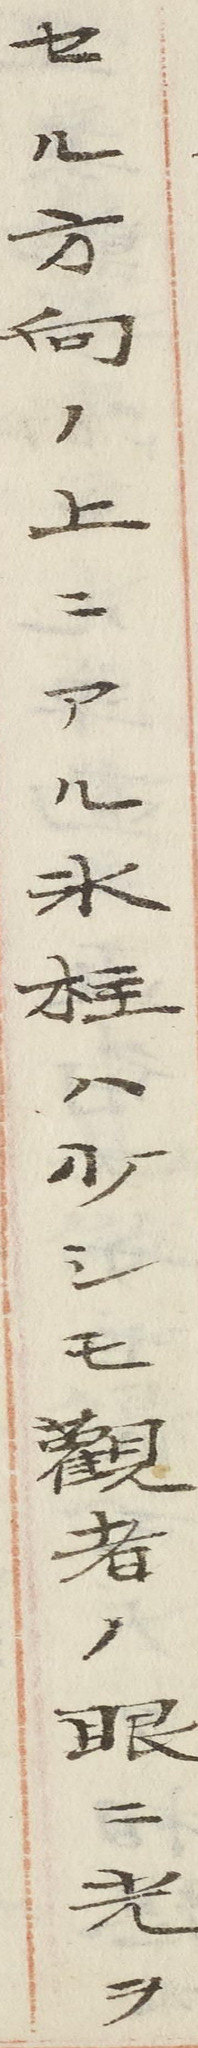セル方向ノ上ニアル氷柱ハ少シモ観者ノ眼ニ光ヲ
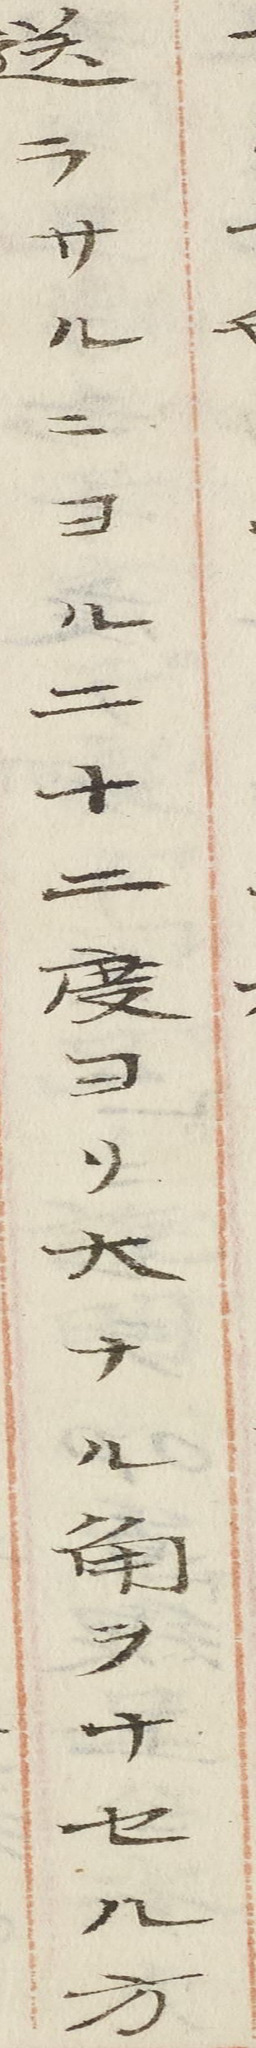送ラサルニヨル二十二度ヨリ大ナル角ヲナセル方
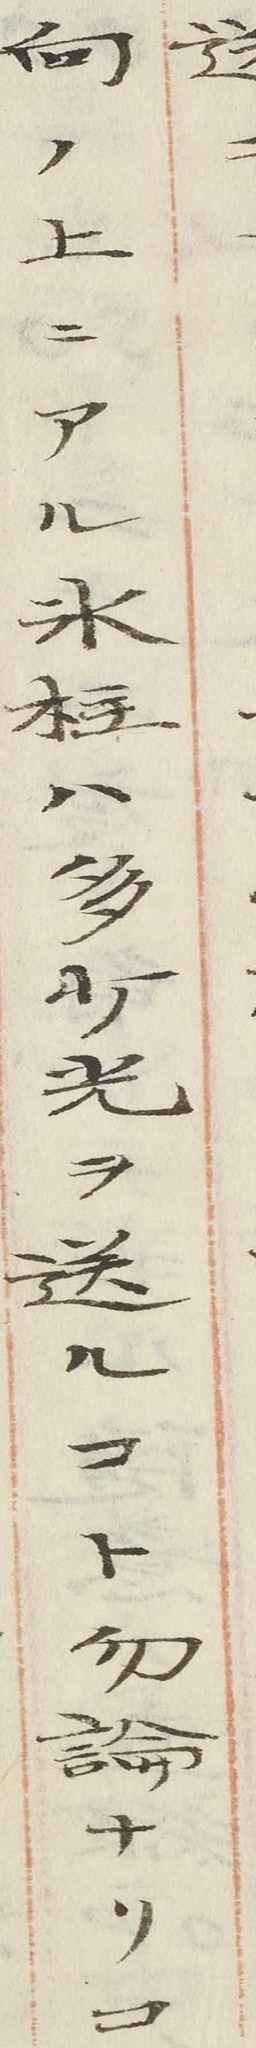向ノ上ニアル氷柱ハ多少光ヲ送ルコト勿論ナリコ
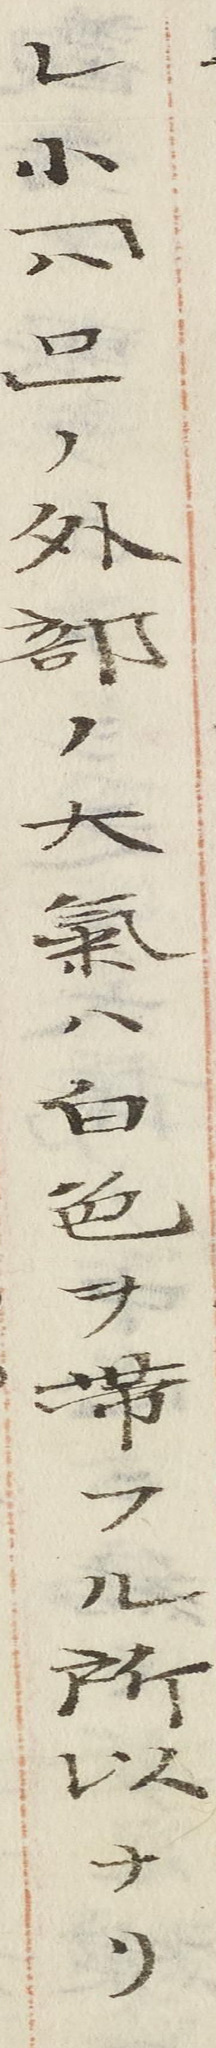レ小「ハロ」ノ外部ノ大気ハ白色ヲ帯フル所以ナリ
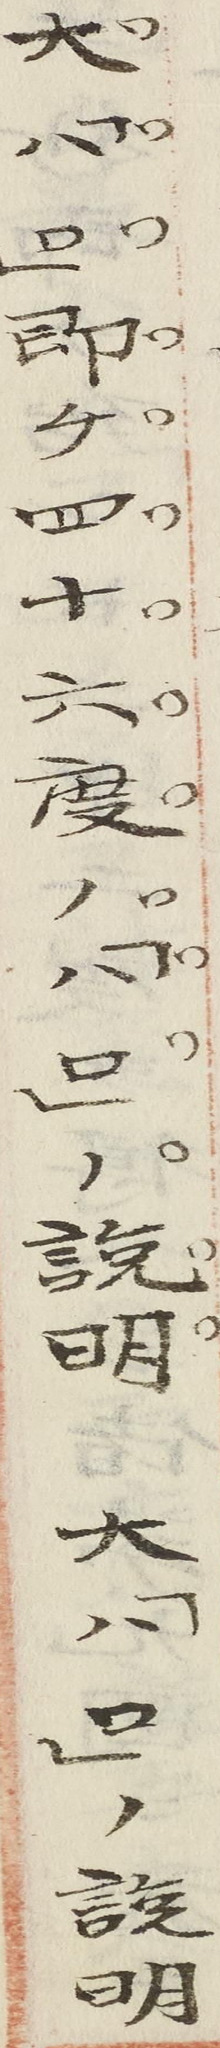大「ハロ」即チ四十六度ノ「ハロ」ノ説明大「ハロ」ノ説明
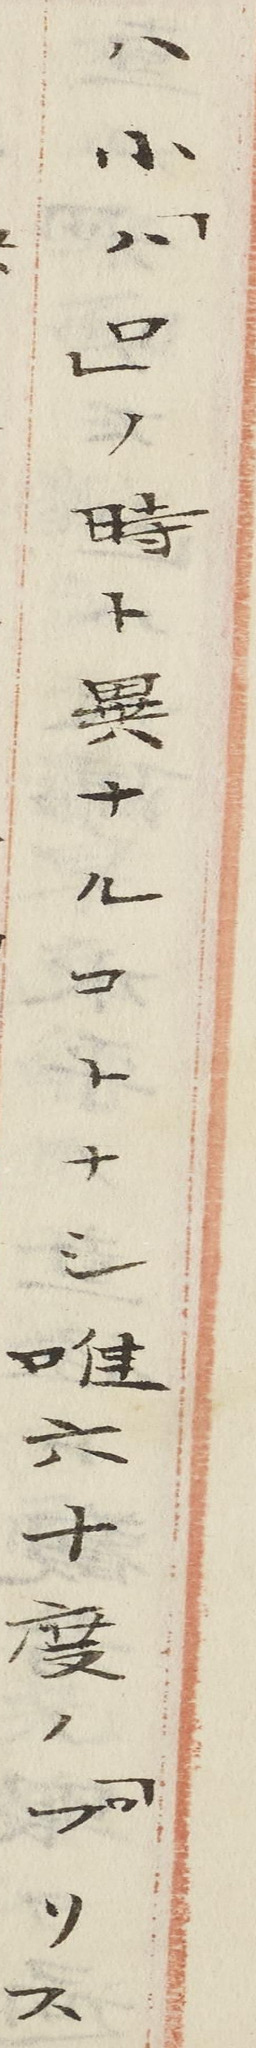ハ小「ハロ」ノ時ト異ナルコトナシ唯六十度ノ「プリス
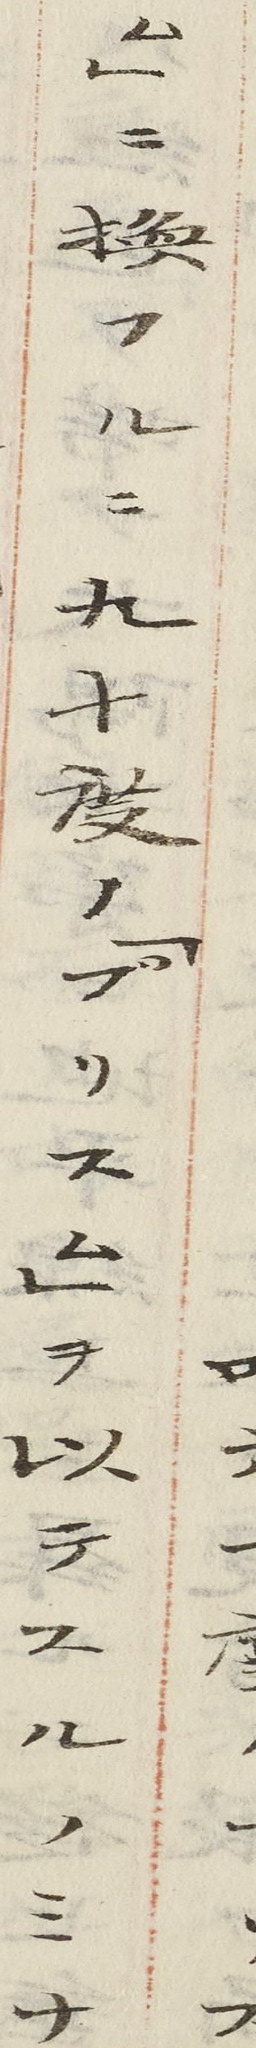ム」ニ換フルニ九十度ノ「プリスム」ヲ以テスルノミナ
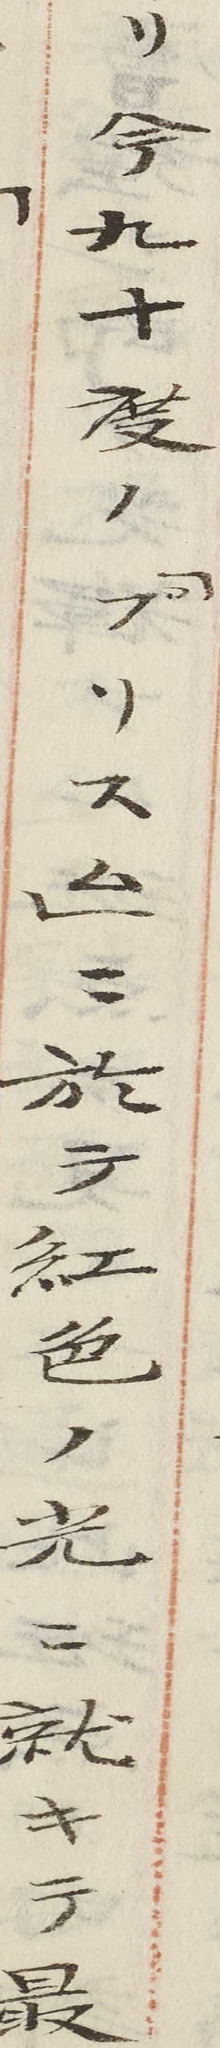リ今九十度ノ「プリスム」ニ於テ紅色ノ光ニ就キテ最
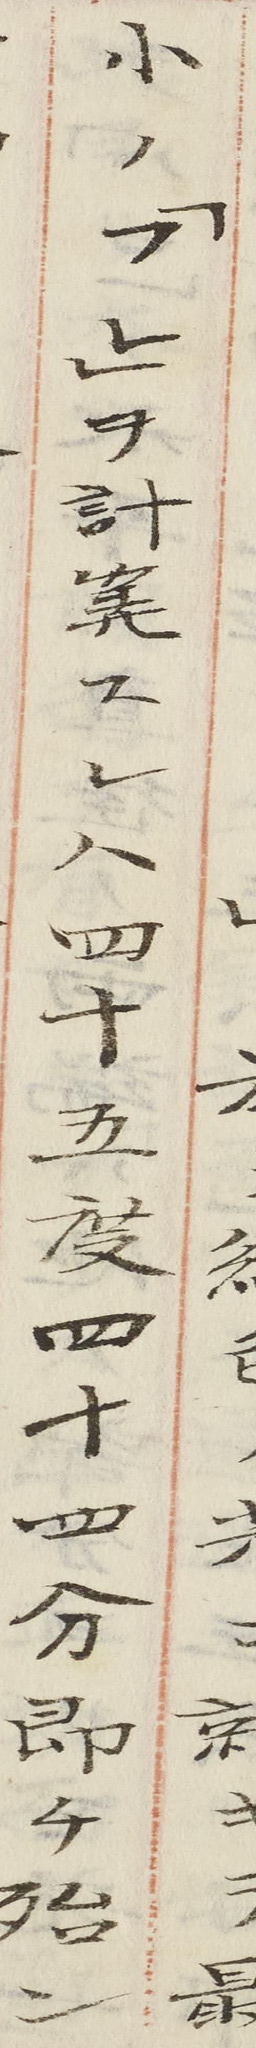小ノ「フレ」ヲ計算スレハ四十五度四十四分即チ殆ン
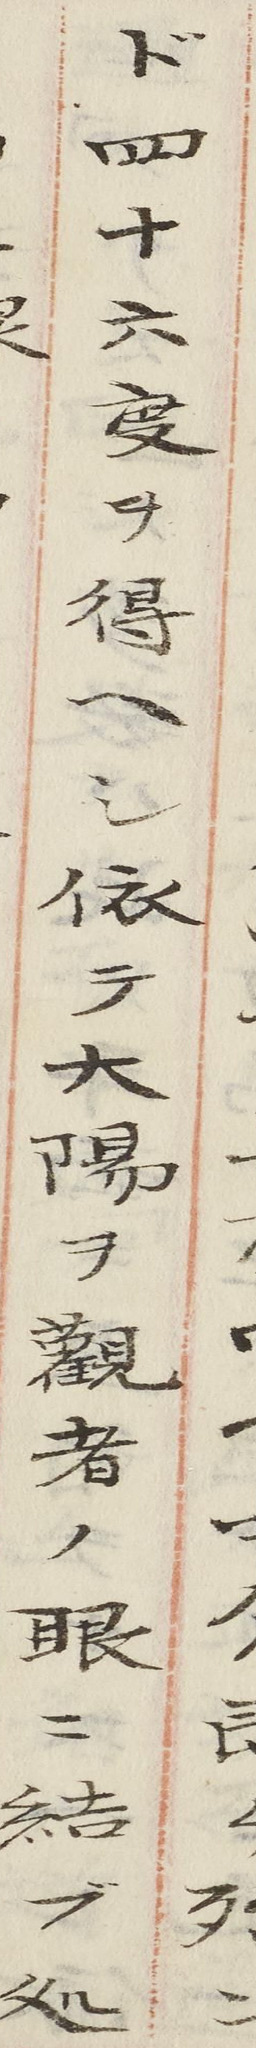ド四十六度ヲ得ヘシ依テ大陽ヲ観者ノ眼ニ結ブ処
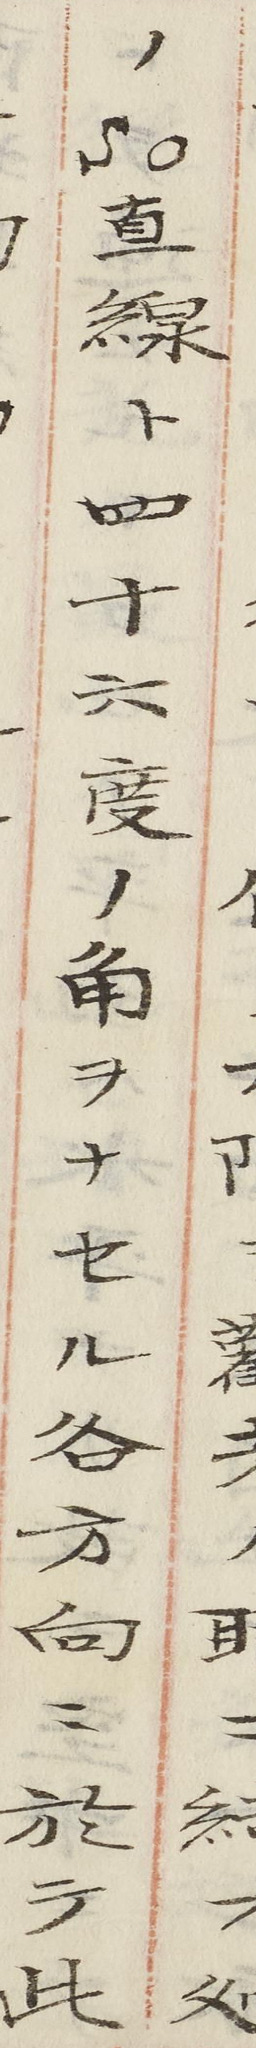ノＳＯ直線ト四十六度ノ角ヲナセル各方向ニ於テ此
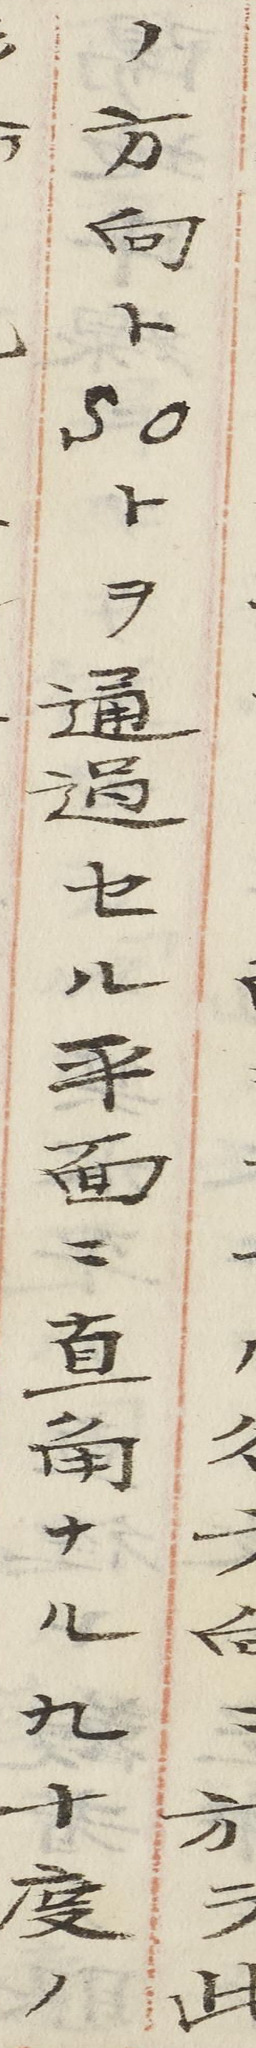ノ方向トＳＯトヲ通過セル平面ニ直角ナル九十度ノ
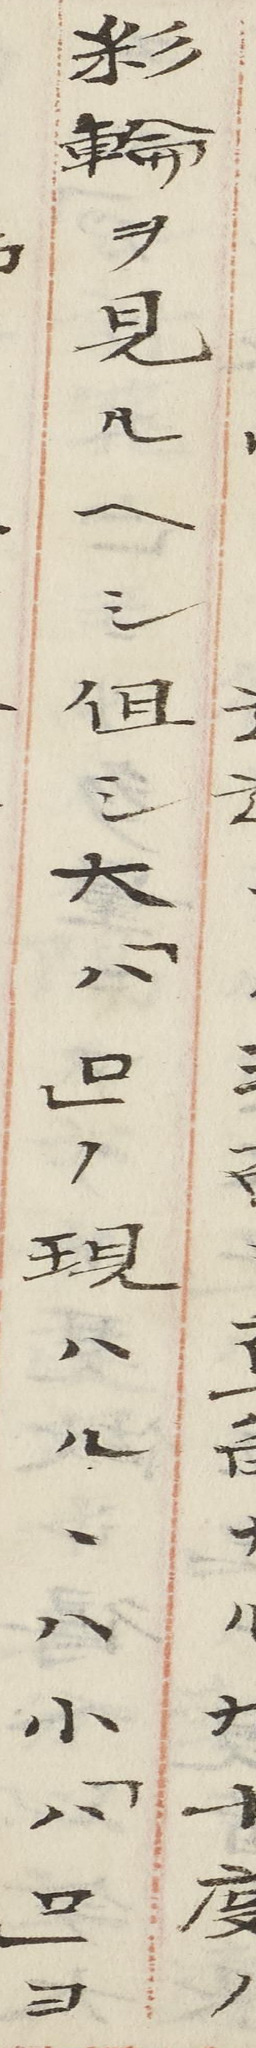彩輪ヲ見ルヘシ但シ大「ハロ」ノ現ハルヽハ小「ハロ」ヨ
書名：虹及ハロノ説明
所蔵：東京大学地震研究所図書室 Earthquake Research Institute Library, The University of Tokyo, JAPAN
